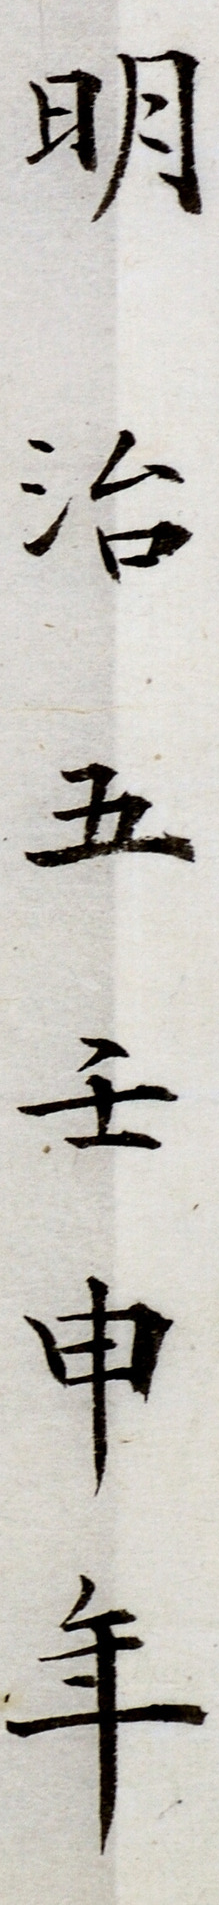明治五壬申年
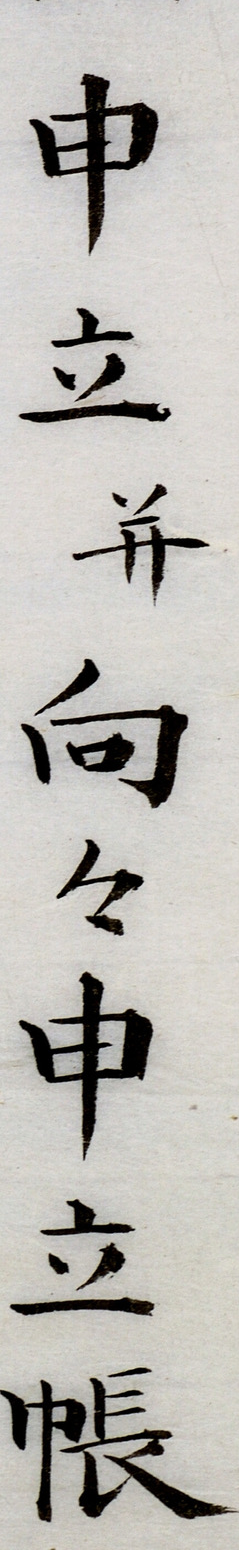諸申立并向々申立帳

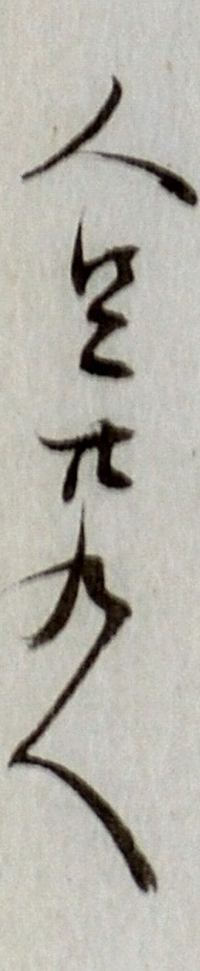人足廿九人
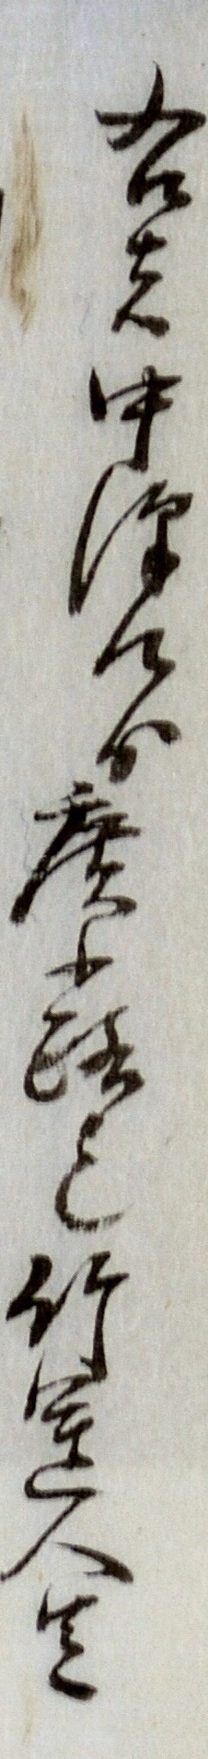右は中沢郷ゟ広小路迄竹運人足
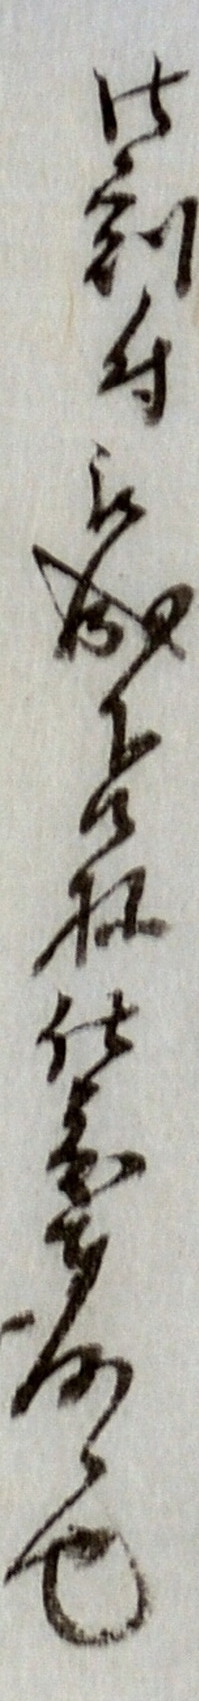御割付被成下候様仕度御座候也
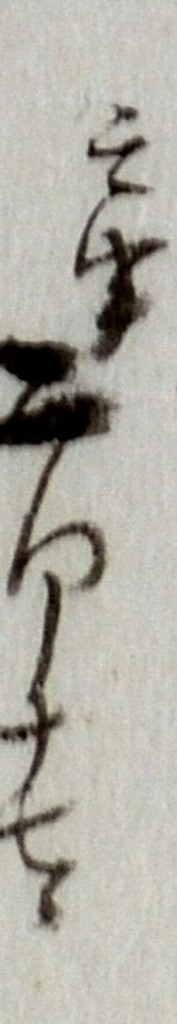二月十七日
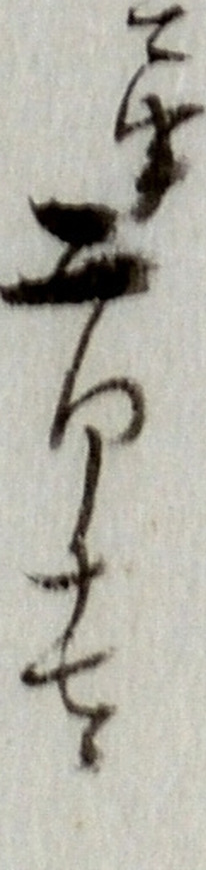二月十七日
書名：諸申立并向々申立帳
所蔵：伊那市立高遠町図書館・合同会社AMANE
